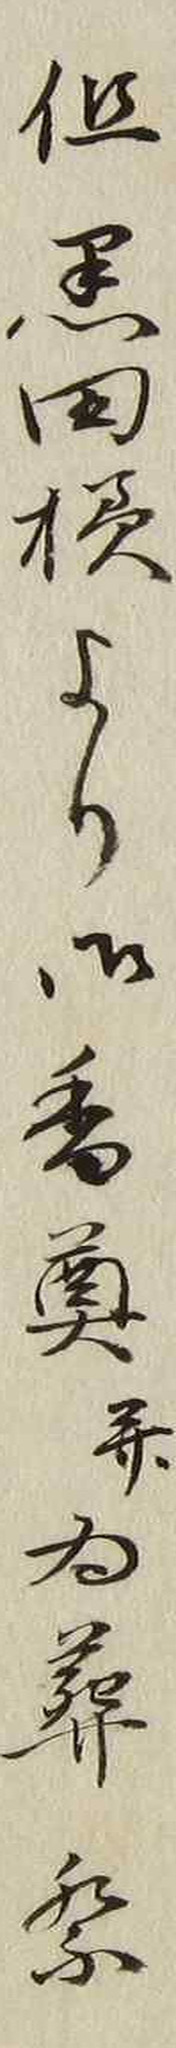但し黒田様より御香典幷葬祭
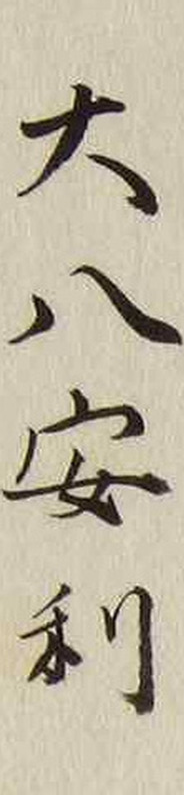大八安利

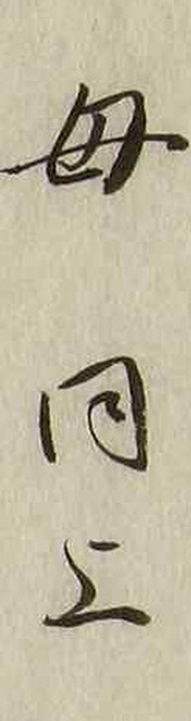母同上
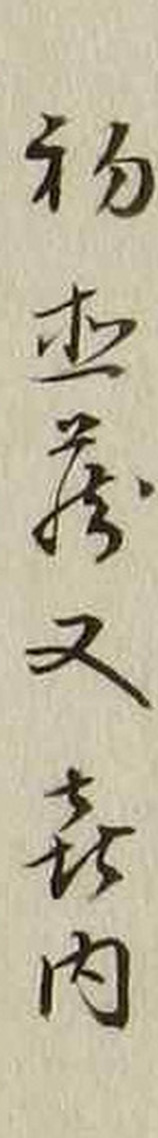初直蔵又喜内
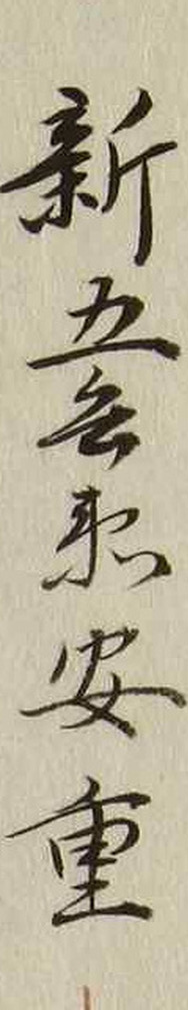新五兵衛安重
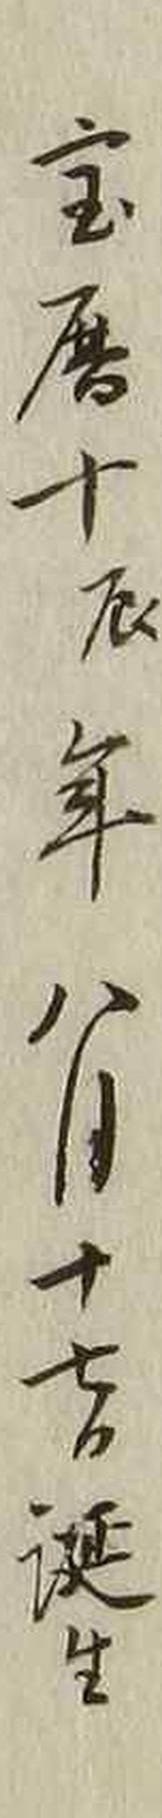宝暦十辰年八月十七日誕生
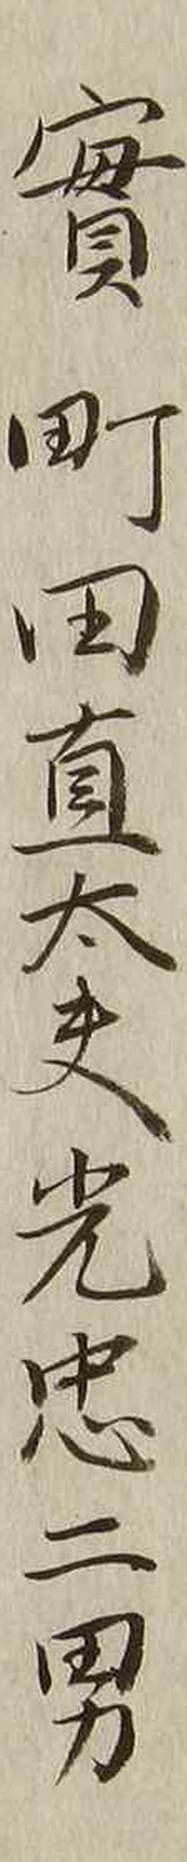実町田真太夫光忠二男
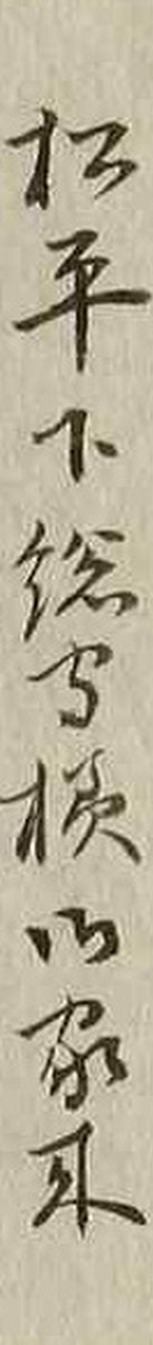松平下総守様御家来
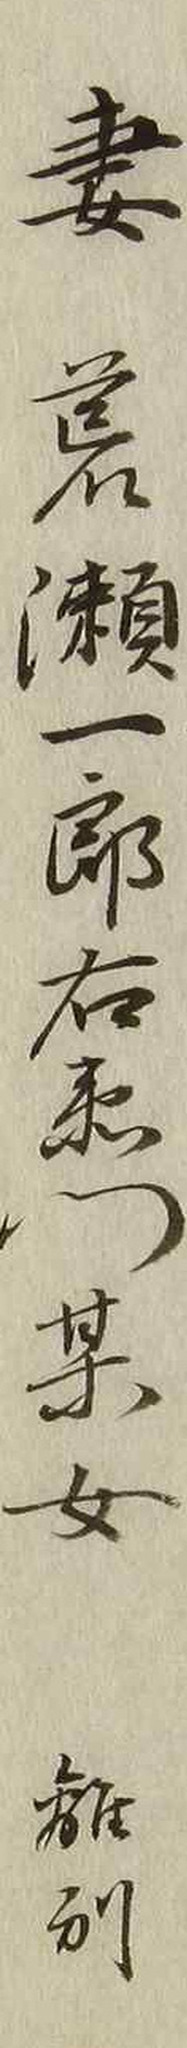妻荒瀬一郎右衛門某女
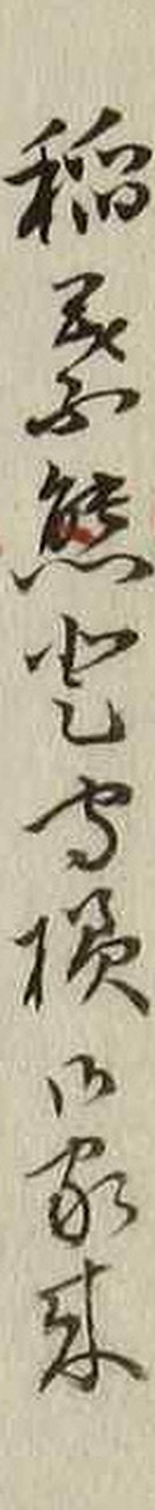稲葉能登守様御家来
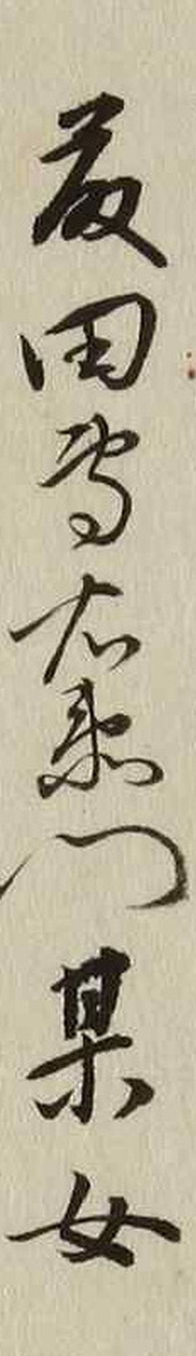藤田専右衛門某女
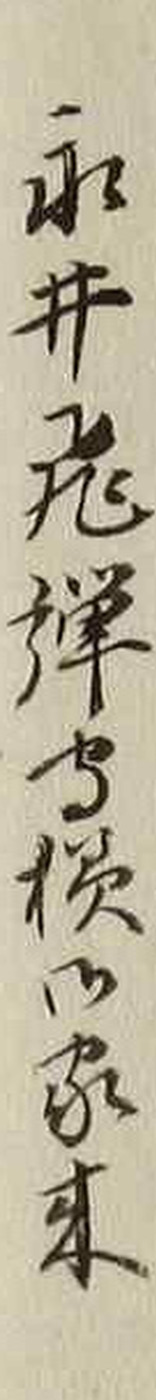永井飛騨守様御家来
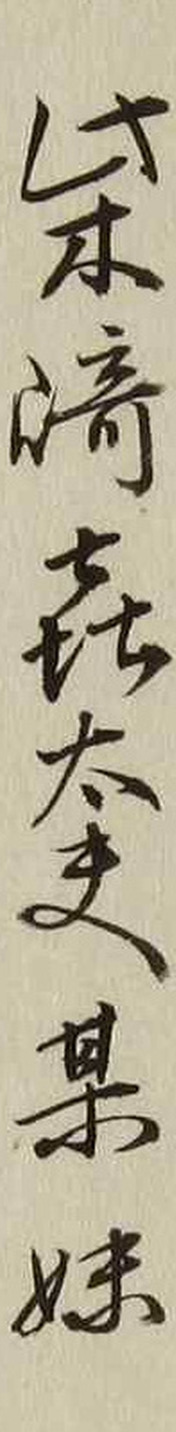柴崎喜太夫某妹
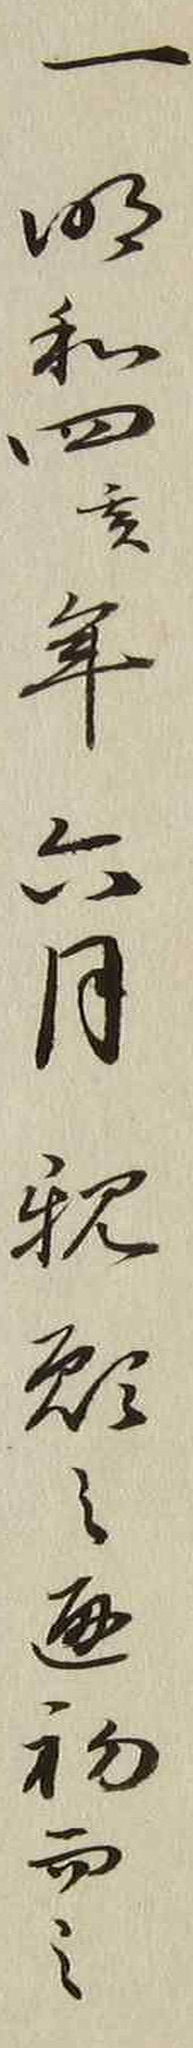一明和四亥年六月親願之通り初めて之
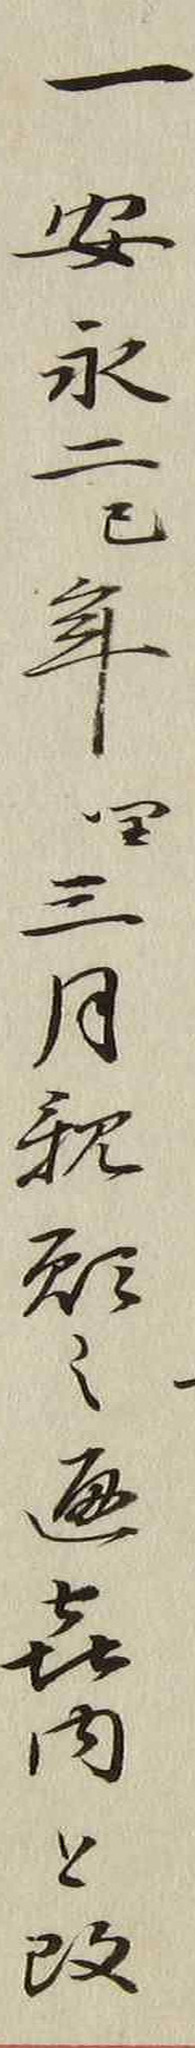一安永二巳年閏三月親願之通り喜内と改
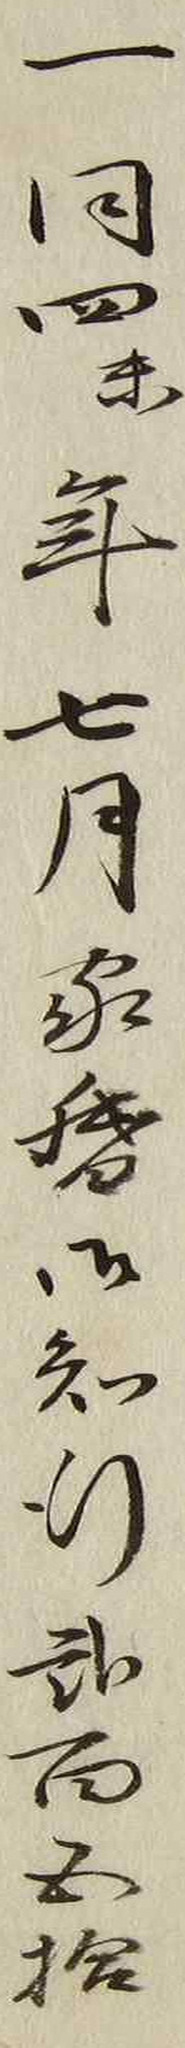一同四未年七月家督御弐百五拾
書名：諸士系譜　巻之19　い之部19
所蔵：会津若松市立会津図書館
